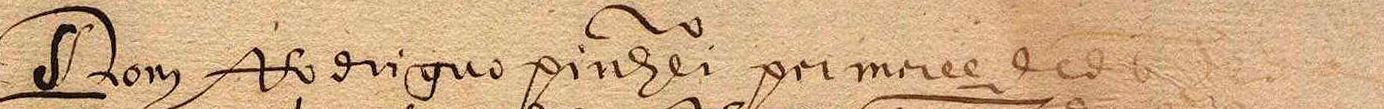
Dom Rodriguo pinheiro per merce de d̄s he da
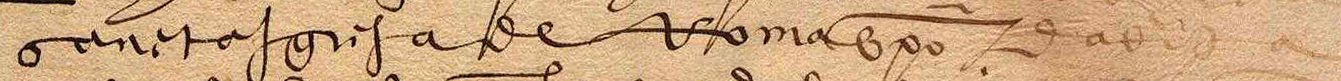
sancta JgreJa de Roma b̄po / da dita
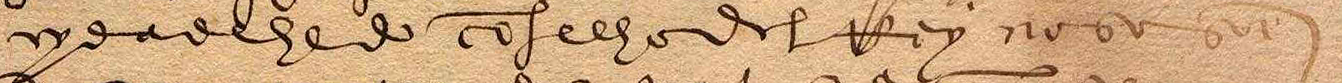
cydade he do cōselho del Rey noso s̄or
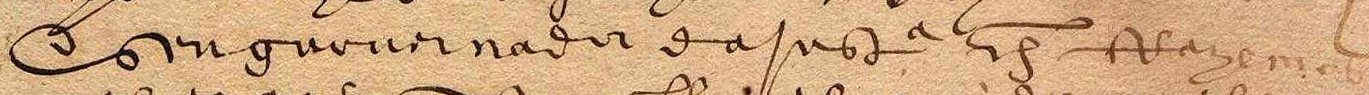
e seu guouernador da Justa c̄ꝭ ffazemos
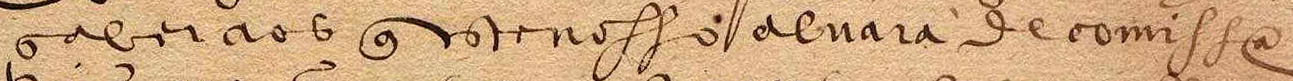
saber aos q̄ este nosso aluara de comissā
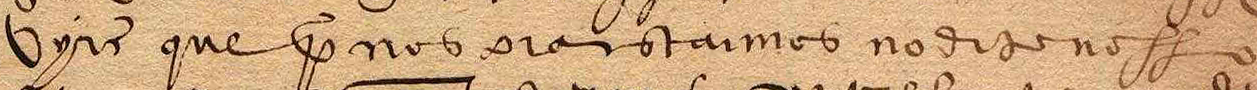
vyrē que p̄o nos ora estarmos no dito nosso
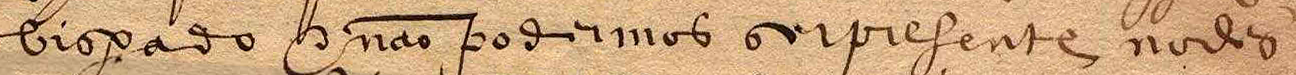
bispado e não podermos ser presente no des
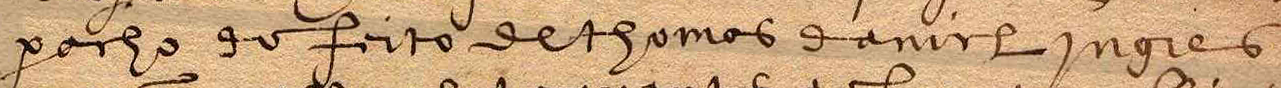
pacho do feito de thomas danieL jngres
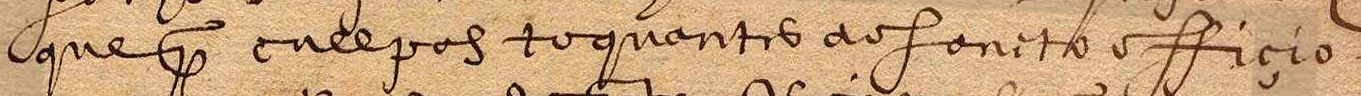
que p̄o cullpas toquantes ao sancto officio
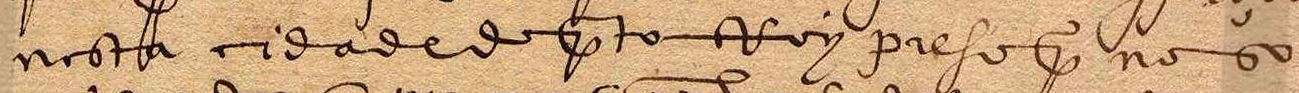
nesta cidade do p̄to ffoy preso p̄o noso
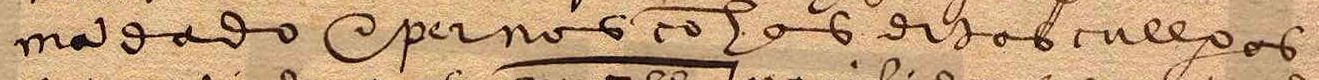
mādado e per nos c̄o has ditas cullpas
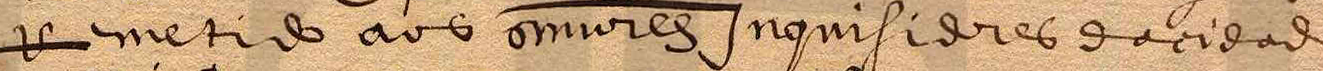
Remetido aos s̄nnores Jnquisidores da cidade
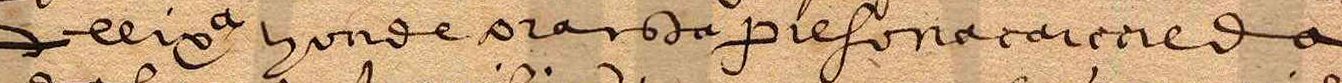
de llixa honde ora esta preso na carcere da
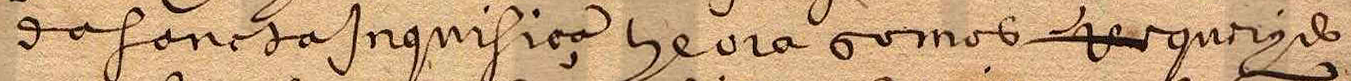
da sancta Jnquisiçā he ora somos Requerydo
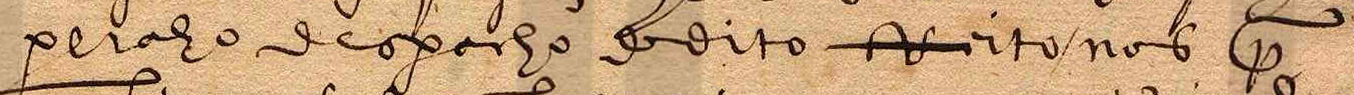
pera ho despacho do dito ffeito / nos p̄o
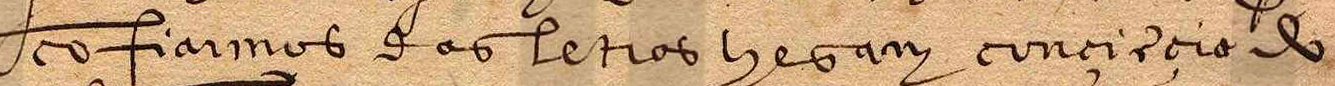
cōfiarmos das Letras he sam conciēcia do
